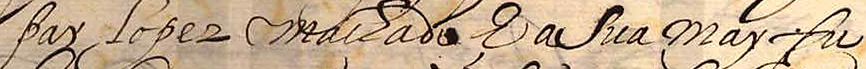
par Lopez machado E a Sua may fu
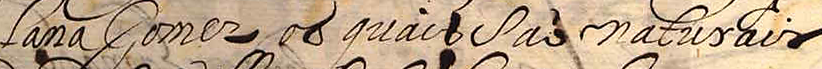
lana Gomez os quais saõ naturais
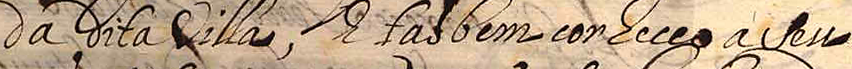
da dita Villa, E taõbem conheceo a seu
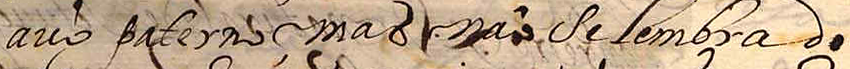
auó paterno mas naõ se Lembra do
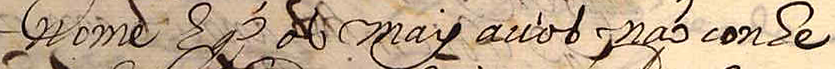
nome E q̄ os mais auós naõ conhe
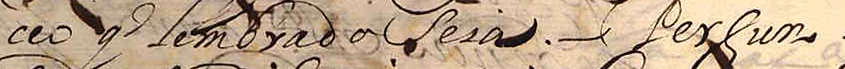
ceo q̄ Lembrado seia. Pergun
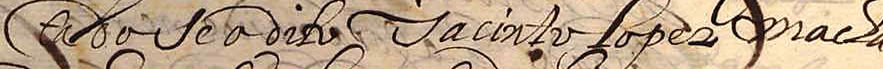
tado se o dito Iacinto Lopez macha
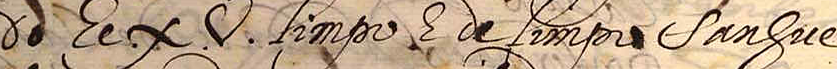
do he X.V. Limpo E de Limpo sangue
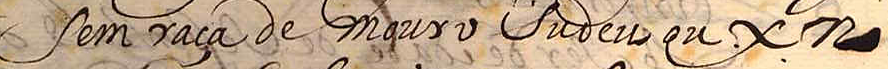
sem raça de mouro Iudeu ou X.N.
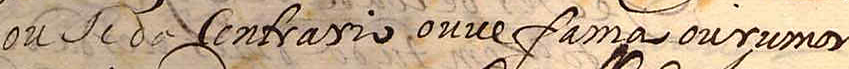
ou se do Contrario ouue fama ou rumor
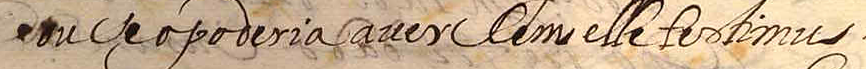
ou se o poderia auer Com elle testimu
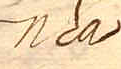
nha
